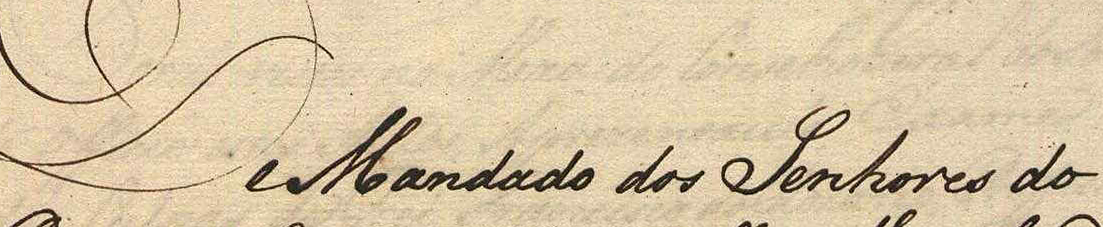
De Mandado dos Senhores do
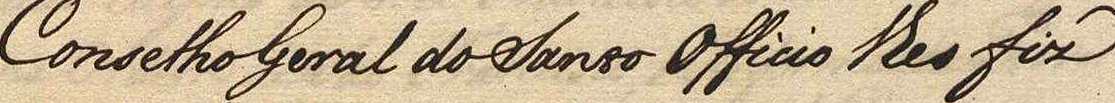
Conselho Geral do Santo Officio lhes fiz
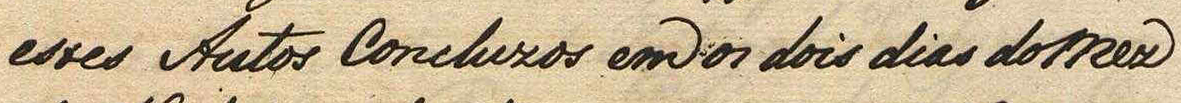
estes Autos Concluzos em os dois dias do mez
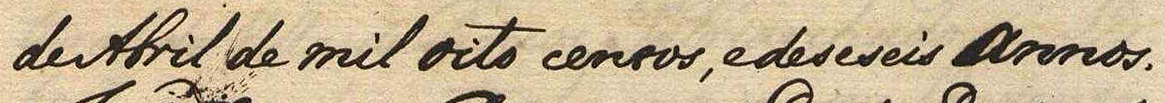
de Abril de mil oitocentos, e deseseis annos.
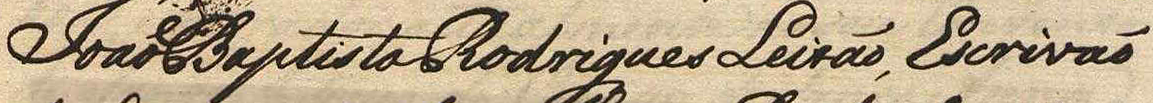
Ioaõ Baptista Rodrigues Leitaõ, Escrivaõ
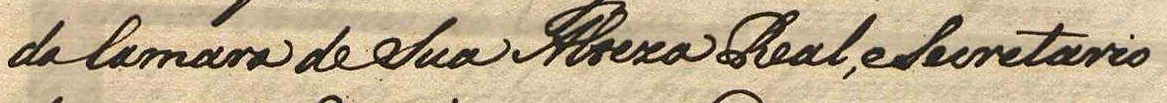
da Camara de Sua Alteza Real, e Secretario
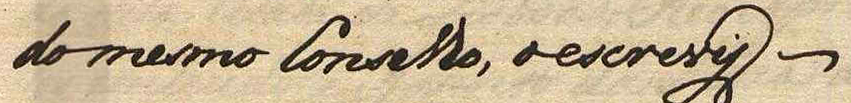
do mesmo Conselho, o escrevy
